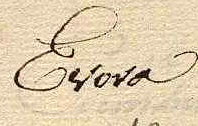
Evora
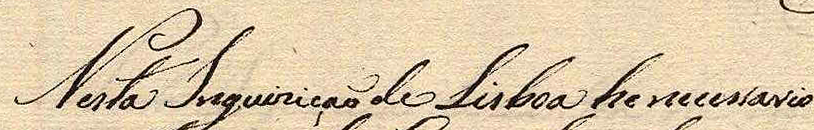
Nesta Inquiziçaõ de Lisboa he necessario
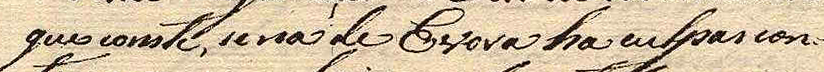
que conste, senaõ de Evora ha culpas con
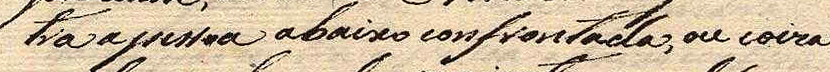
tra a pessoa abaixo confrontada, ou coiza
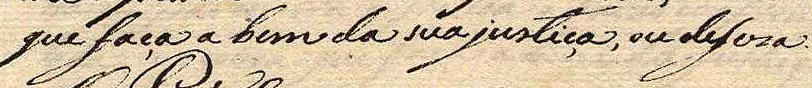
que faça a bem da sua justiça, ou defeza.
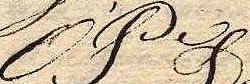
O Pe
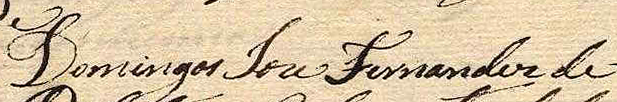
Domingos Ioze Fernandez de
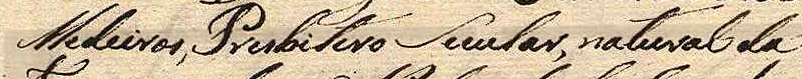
Medeiros, Presbitero Secular, natural da
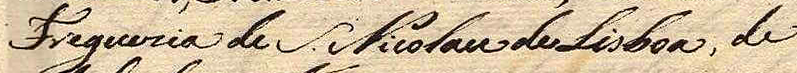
Freguezia de S. Nicolau de Lisboa, de
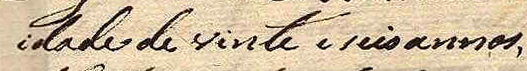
idade de vinte e seis annos,
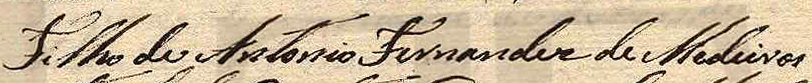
Filho de Antonio Fernandez de Medeiros
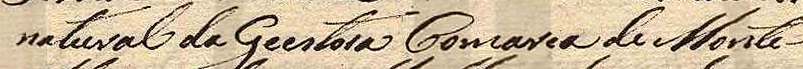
natural da Geestosa, Comarca de Monte
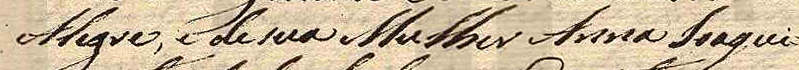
Alegre, e de sua Mulher Anna Ioaqui
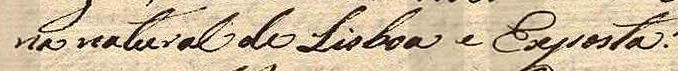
na natural de Lisboa e Exposta.
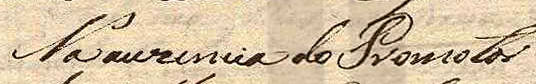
Na auzencia do Promotor
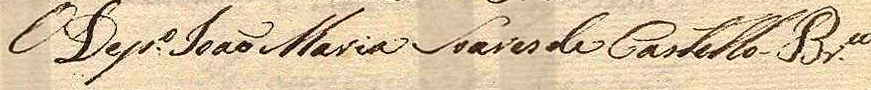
O Dep.o Ioaõ Maria Soares de Castello Br.co
